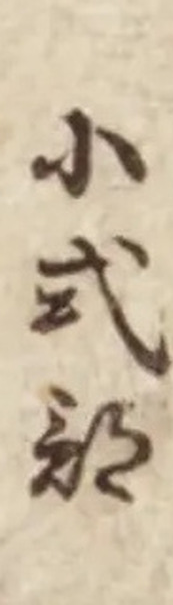小式部
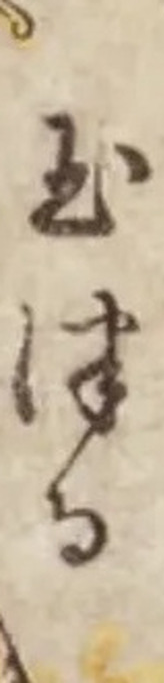玉つる

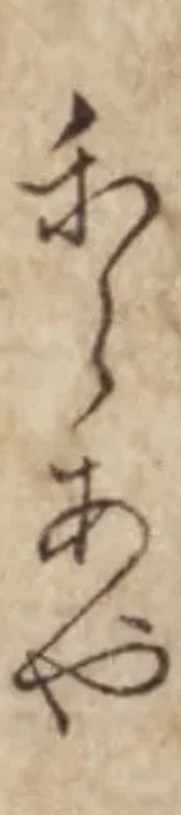からあや

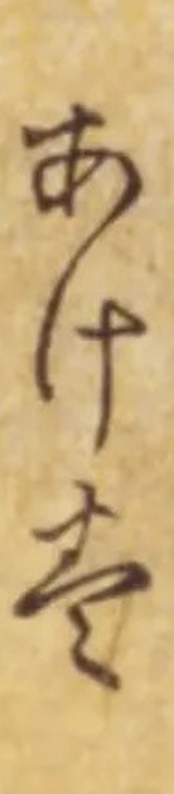あけは
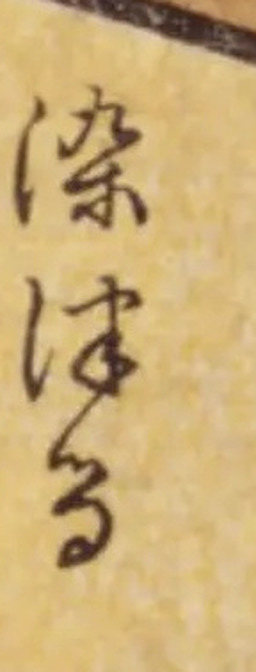染つる
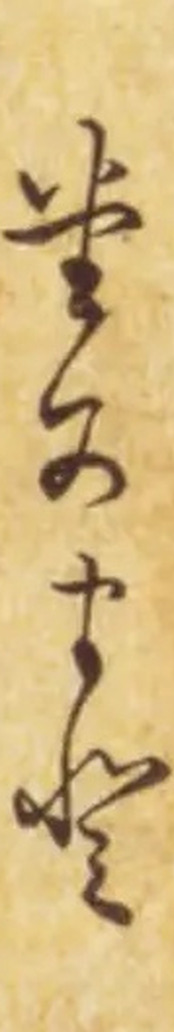たかまと
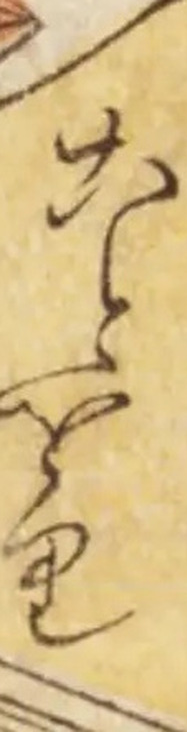ことをり

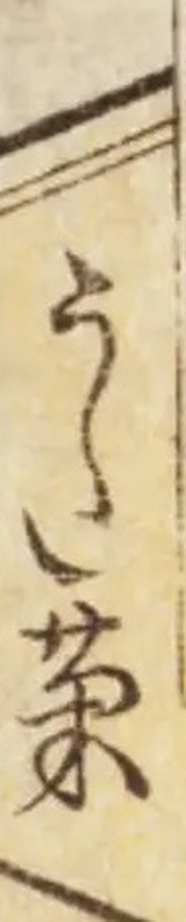うた菊

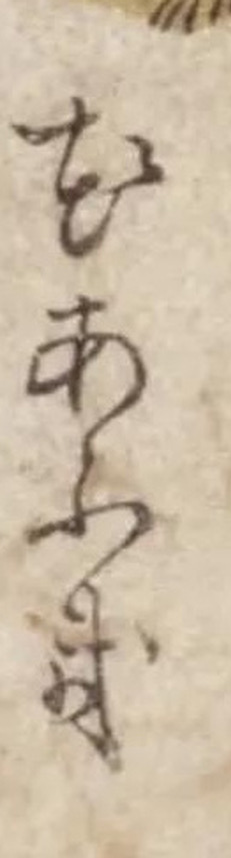花あふき
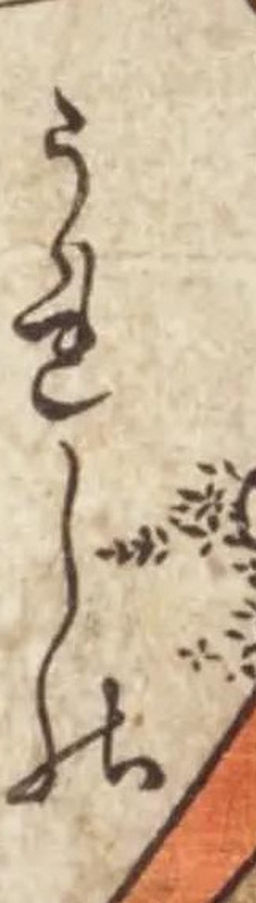うれしの

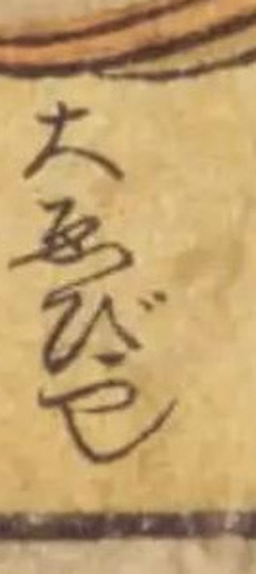大ゑびや
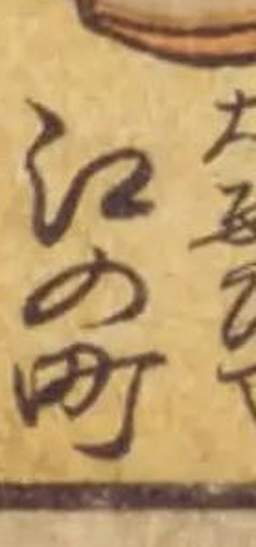江の町
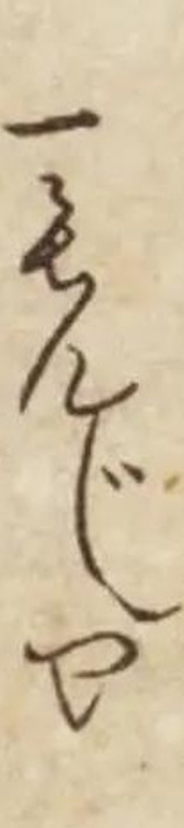一もんじや
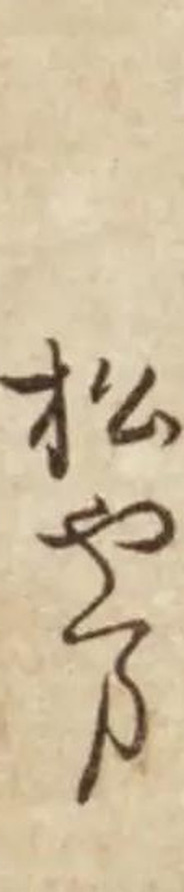松やま
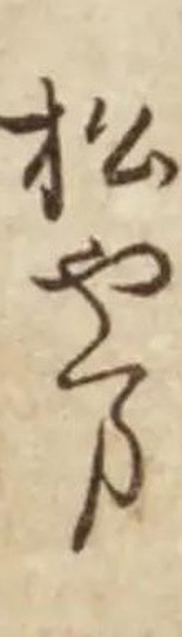松やま

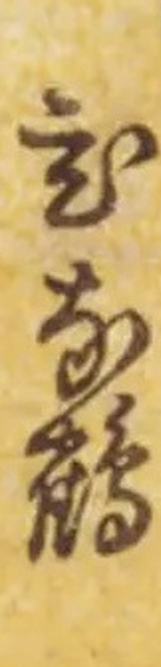ひな鶴
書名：青楼美人合姿鏡. 上
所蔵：国立国会図書館 National Diet Library, JAPAN
